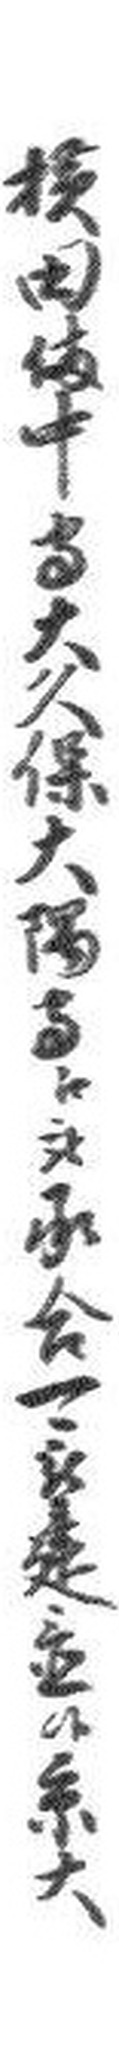横田備中守大久保大隅守江被承合可被建直候京大
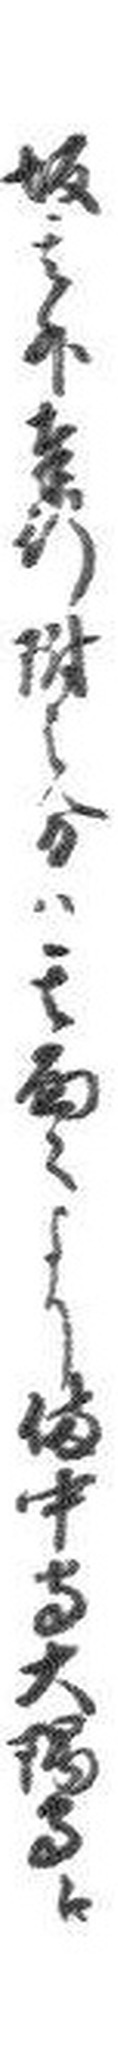坂其外奉行附之分ハ其面々より備中守大隅守江

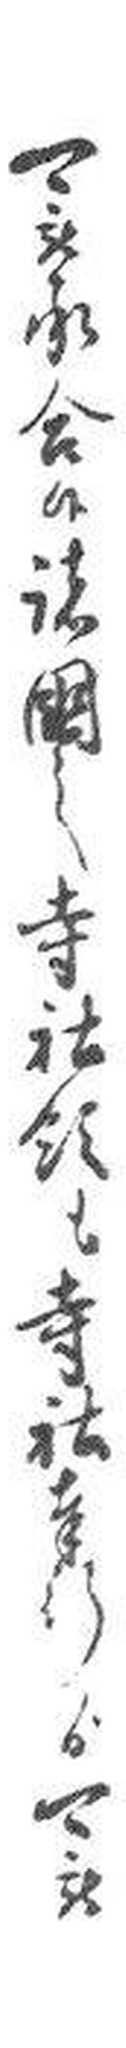可被承合候諸国之寺社領も寺社奉行ゟか可被
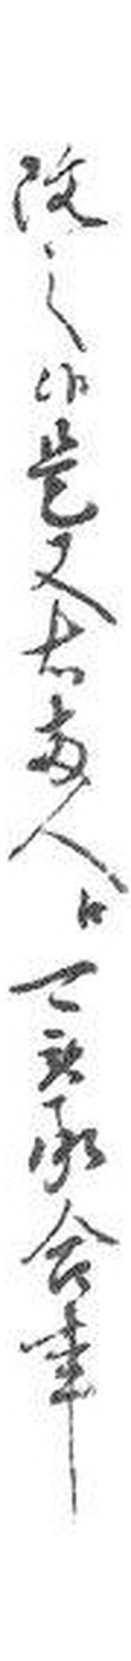改之候是亦右両人江可被承合事
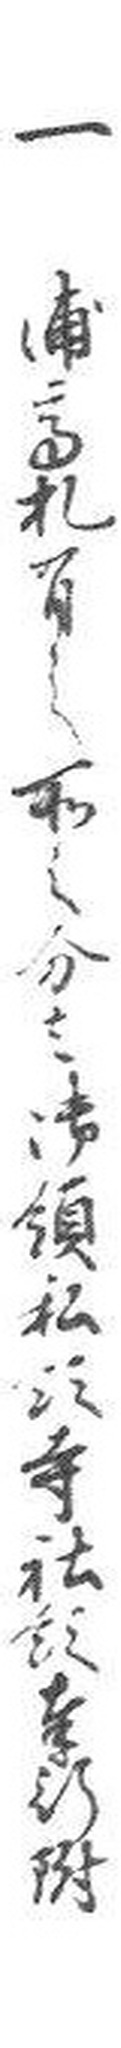一浦高札有之所之分者御領私領寺社領奉行附
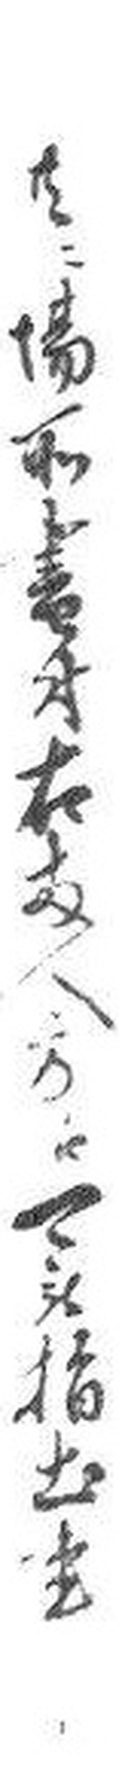共ニ場所書付右両人方江可被指出事
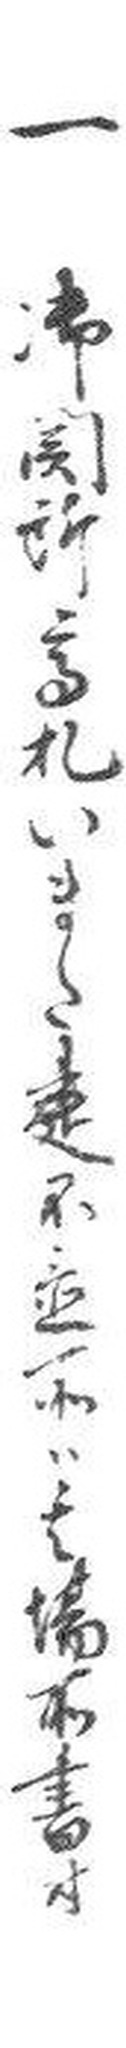一御関所高札いまた建不置所ハ其場所書付
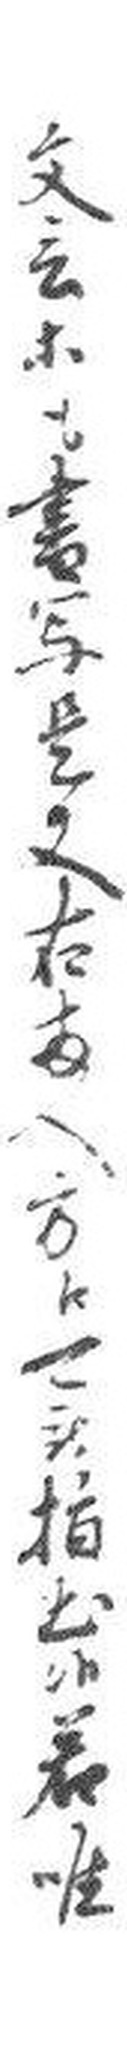文言等も書写是又右両人方へ可被指出候若唯
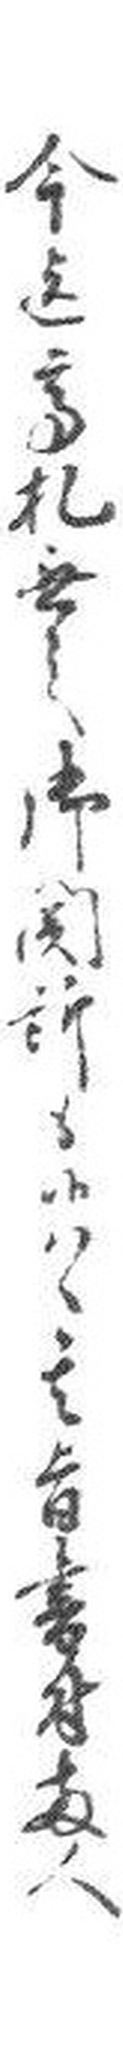今迄高札無之御関所も候ハゝ其旨書付両人
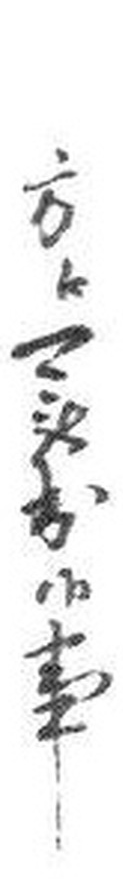方江可被出事
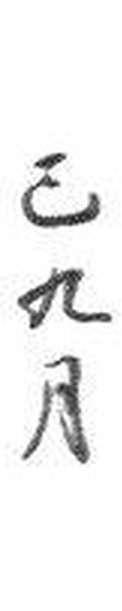巳九月
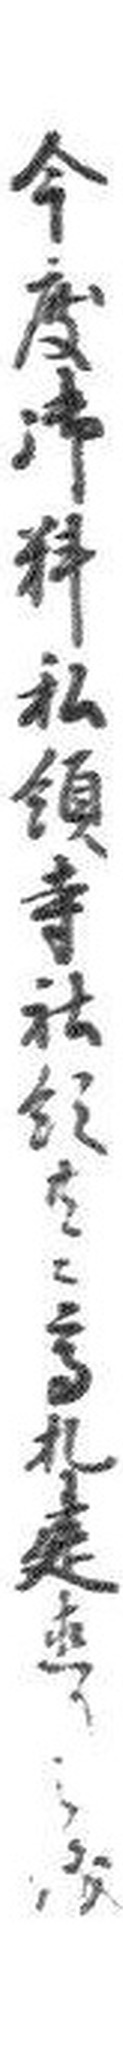今度御料私領寺社領共ニ高札建直リ之儀
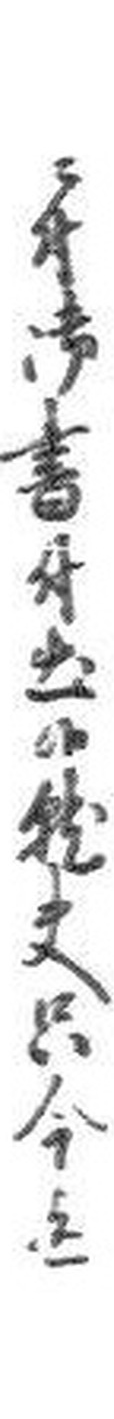ニ付御書付出候就夫只今迄
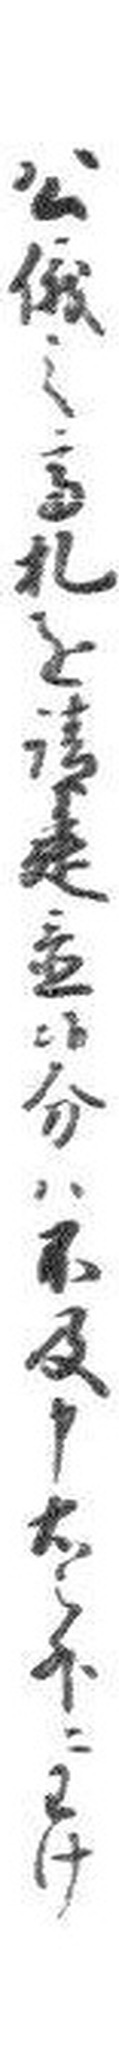公儀之高札を請建置候分ハ不及申右之外ニわけ
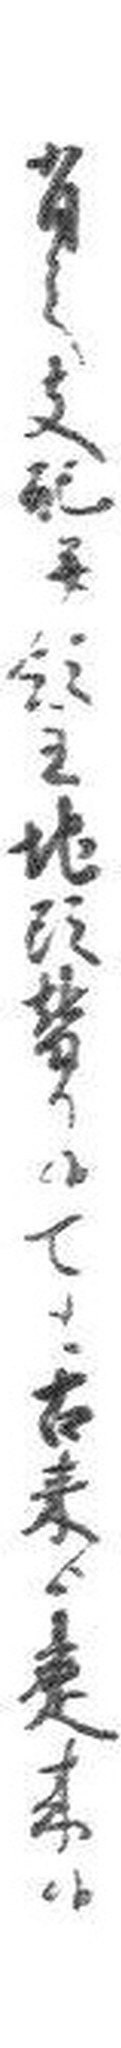有之支配并領主地頭替り候ても古来ゟ建来候
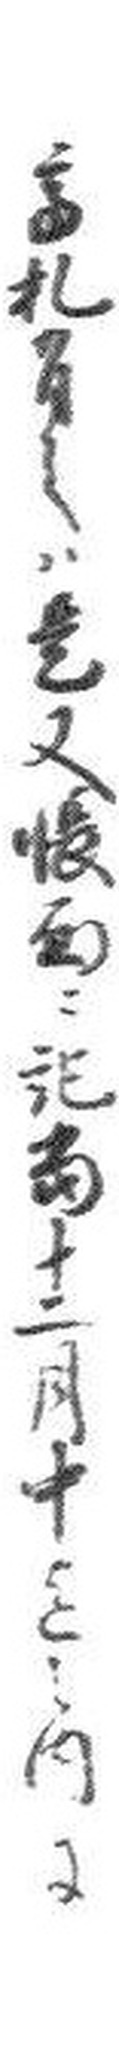高札有之ハ是又帳面ニ記当十二月中迄之内に
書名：家譜 二十九 吉邦公 従正徳二年到正徳三年
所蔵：福井県文書館 Fukui Prefectural Archives
